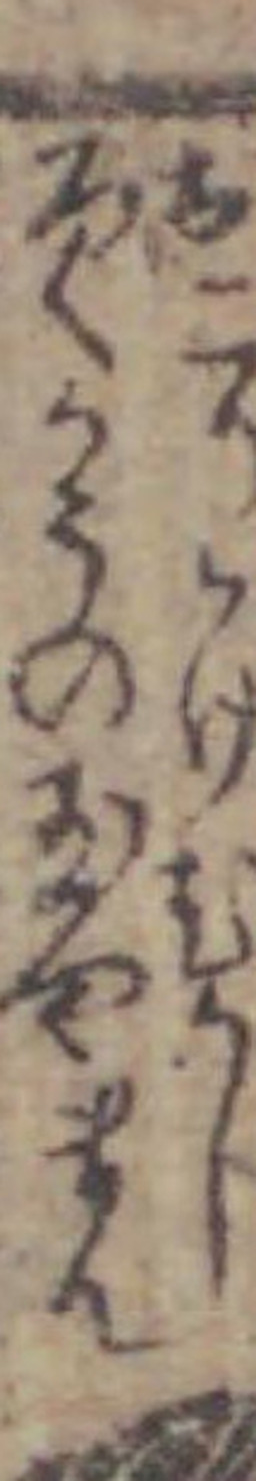ろくかうのおくやまん
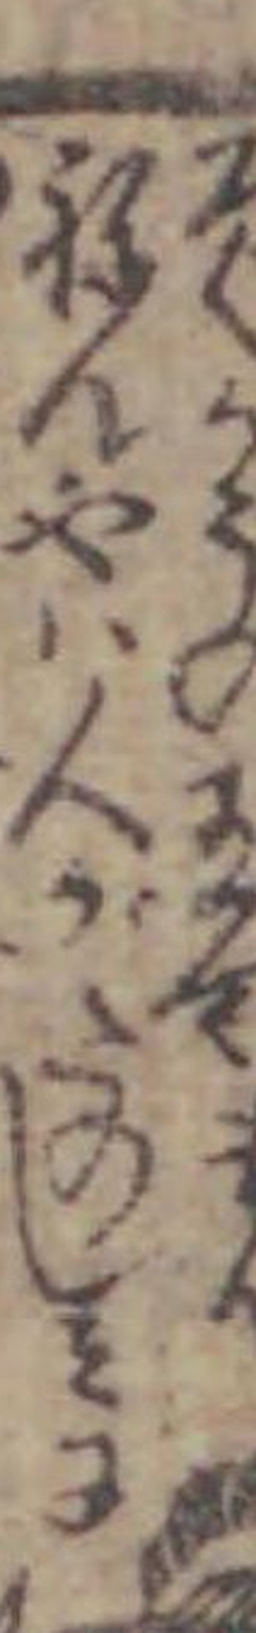ねんやは人がたのしみに
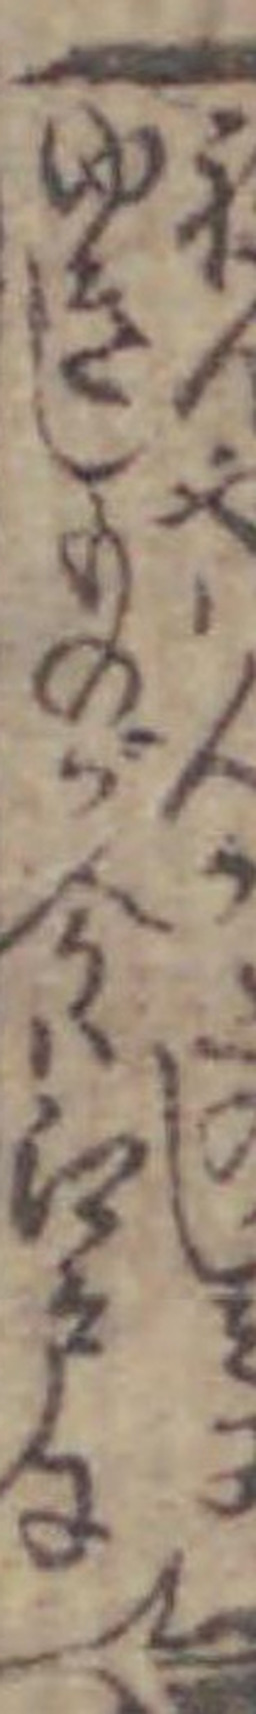ゆきしものが今は江戸に
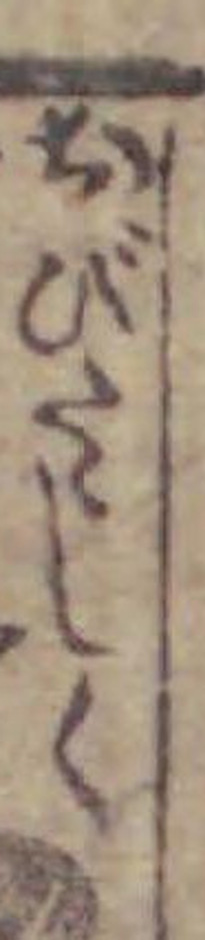おびたゝしく
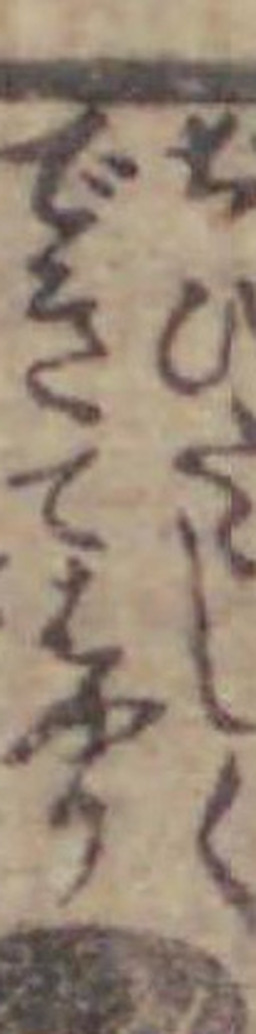できてはやり
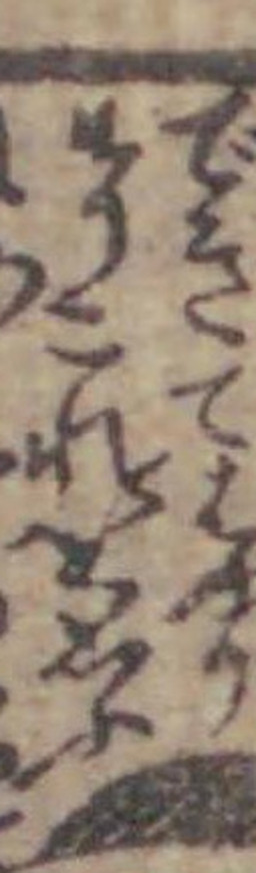けりこれを思ふ
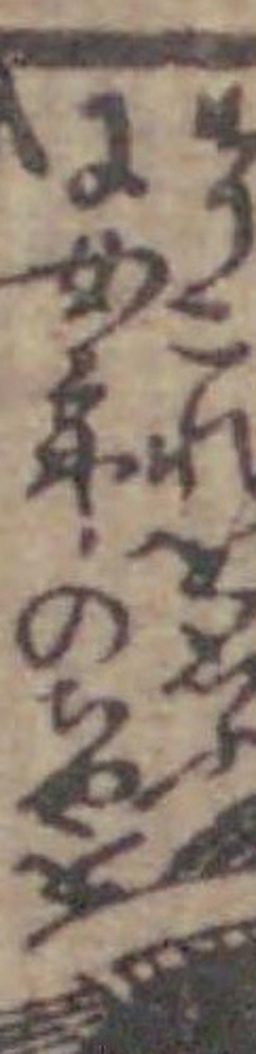に女郎のちやを
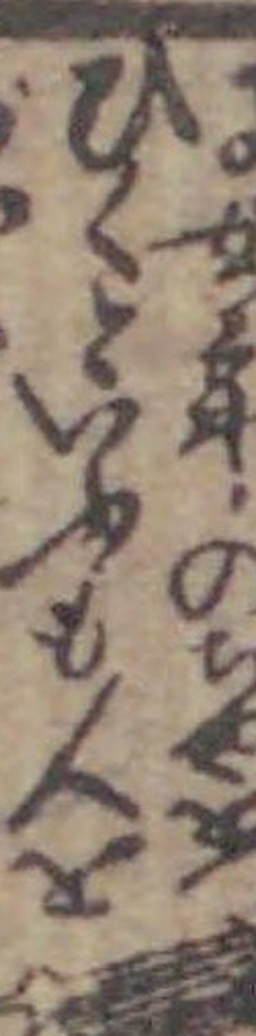ひくといふも人を
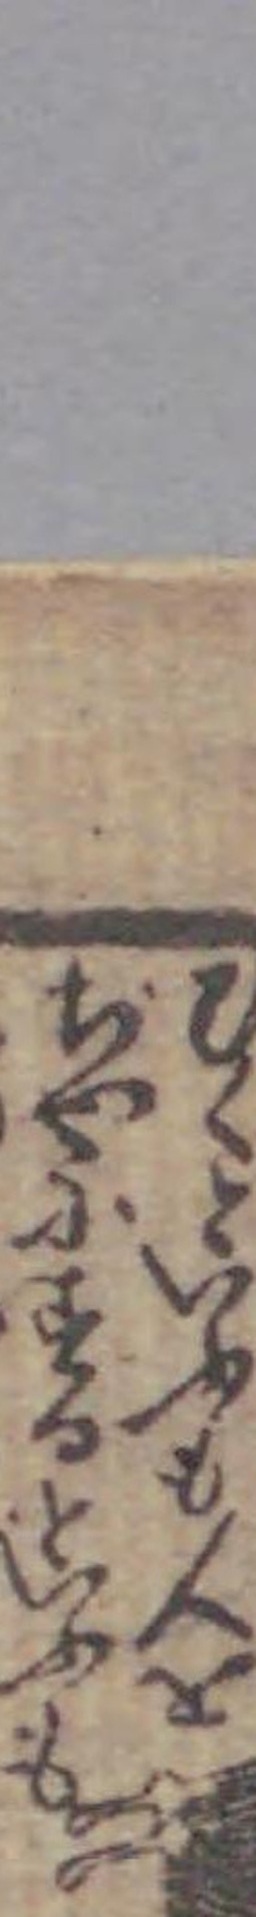ちやにするといふも
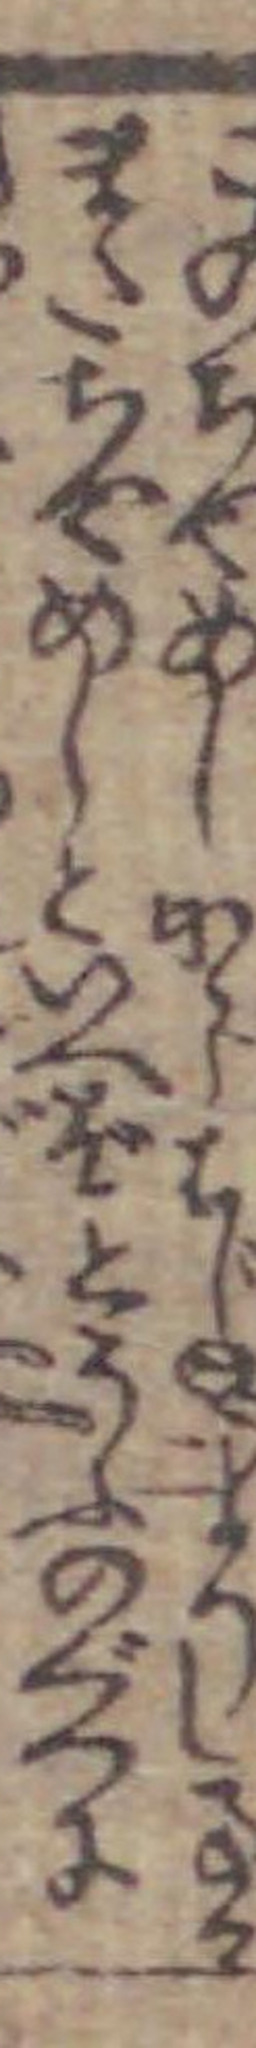またちやめしといへばとうふのぐつに
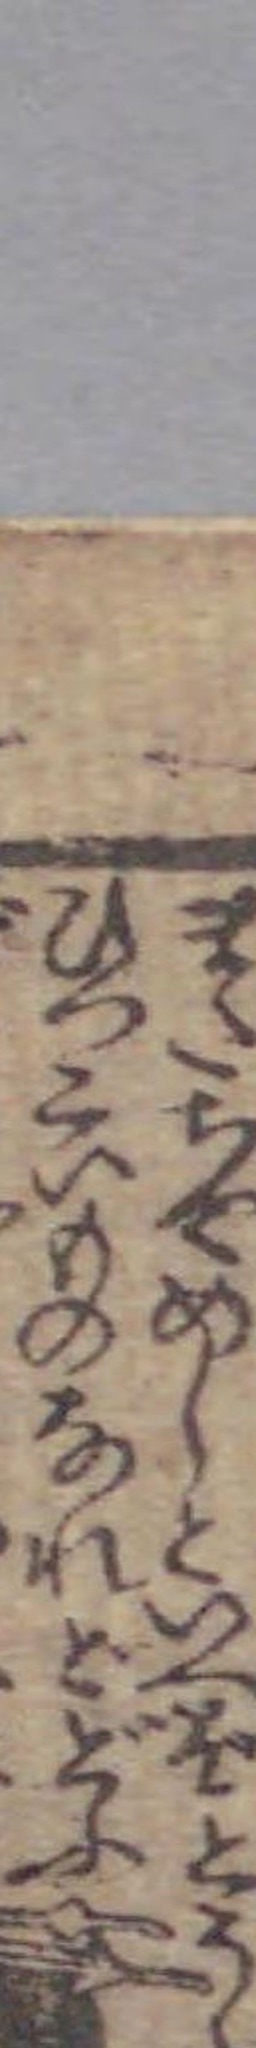ひつこいものなれどどふ
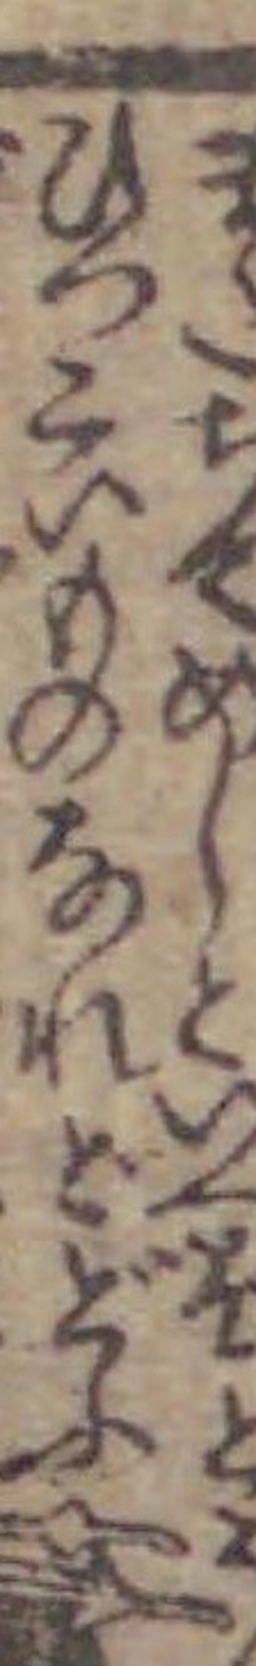ひつこいものなれどどふ
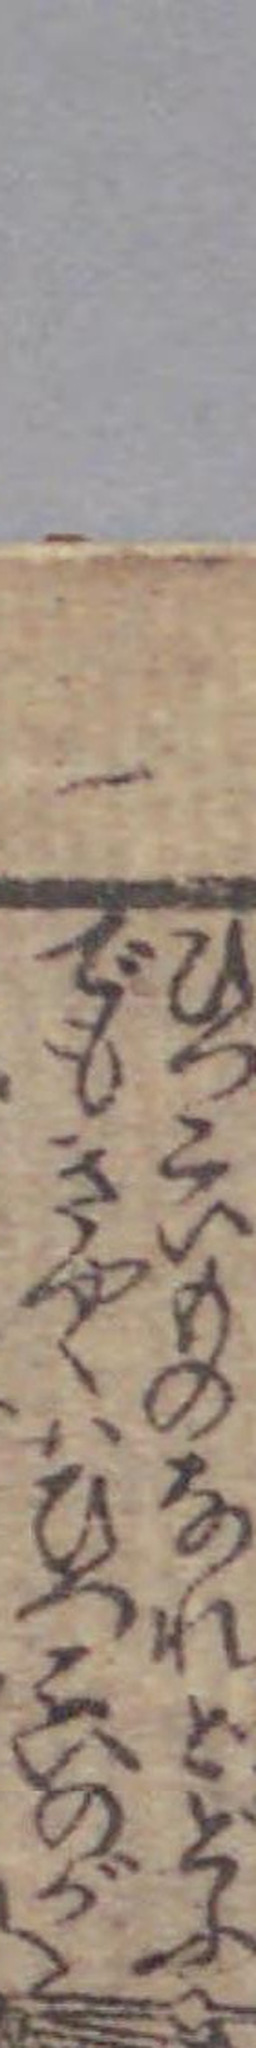でもきやくはひつこいのが
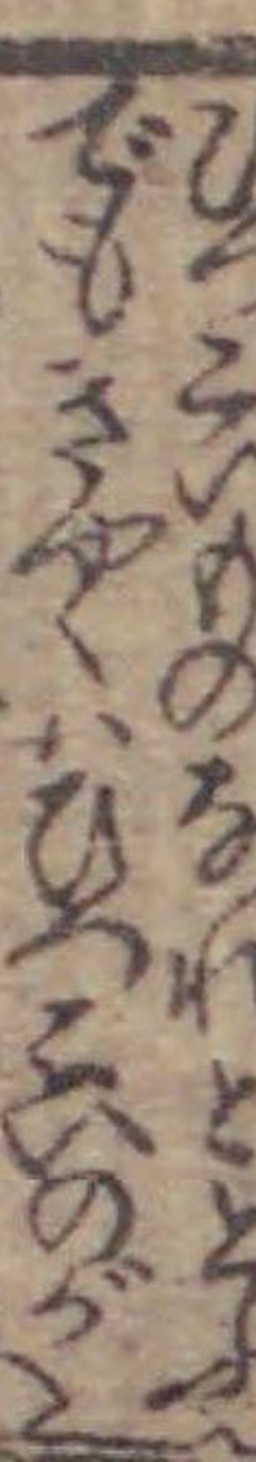でもきやくはひつこいのが
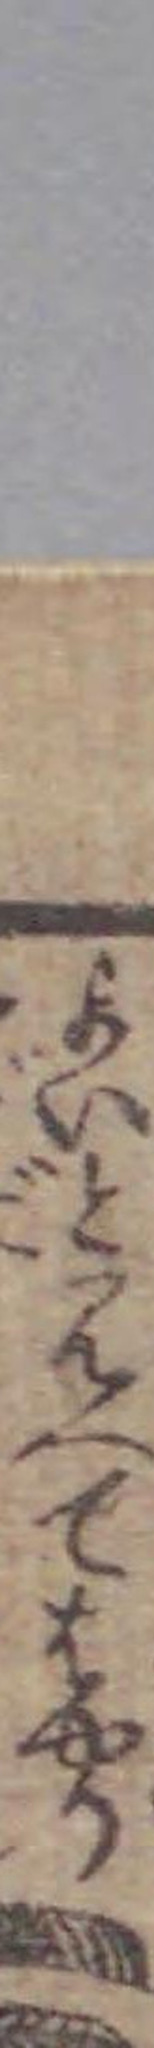よいと見へてはやり
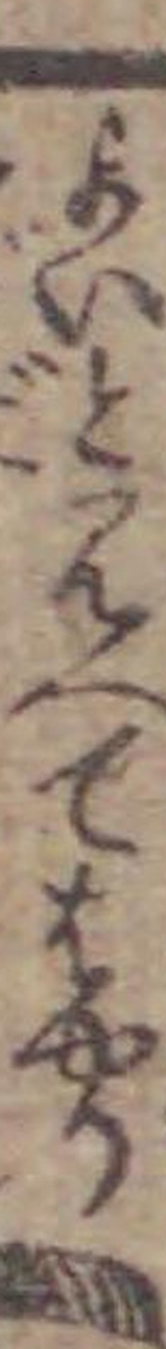よいと見へてはやり
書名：諸事米の飯 : 3巻
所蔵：国立国会図書館 National Diet Library, JAPAN
